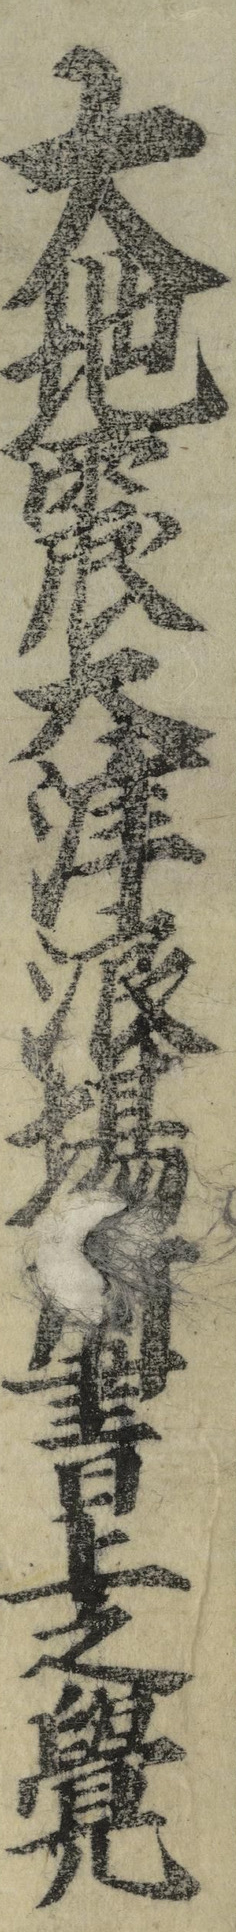大地震大津波場所書上之覚
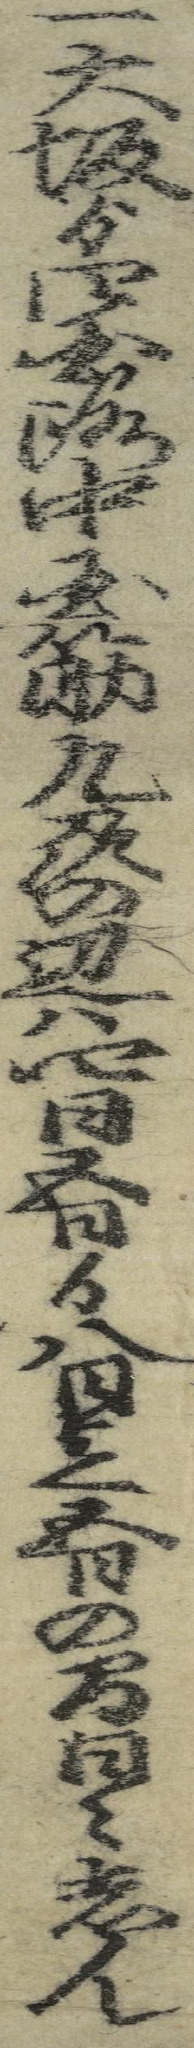一大坂ゟ四国路中国筋九州の辺ハ四日五日ゟ八日迄の間日々しん
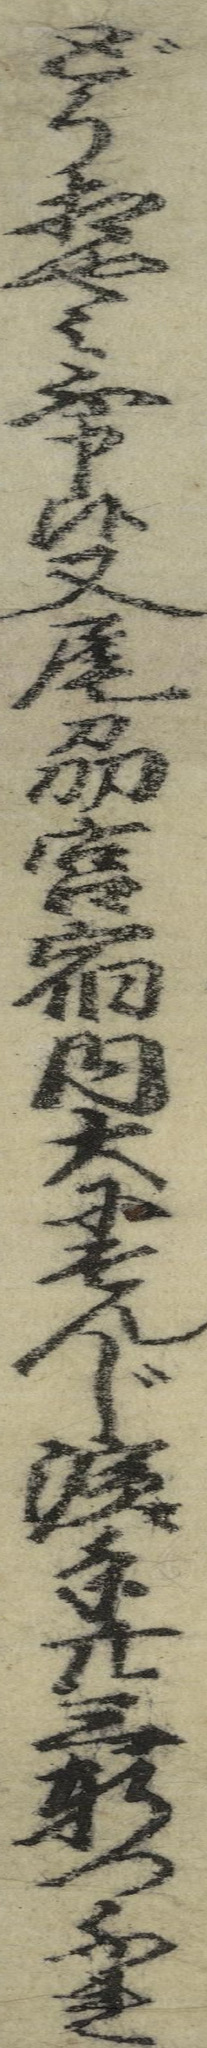どう相也と不申候又尾州宮宿内大にそんじ浜手廿三軒つふれ
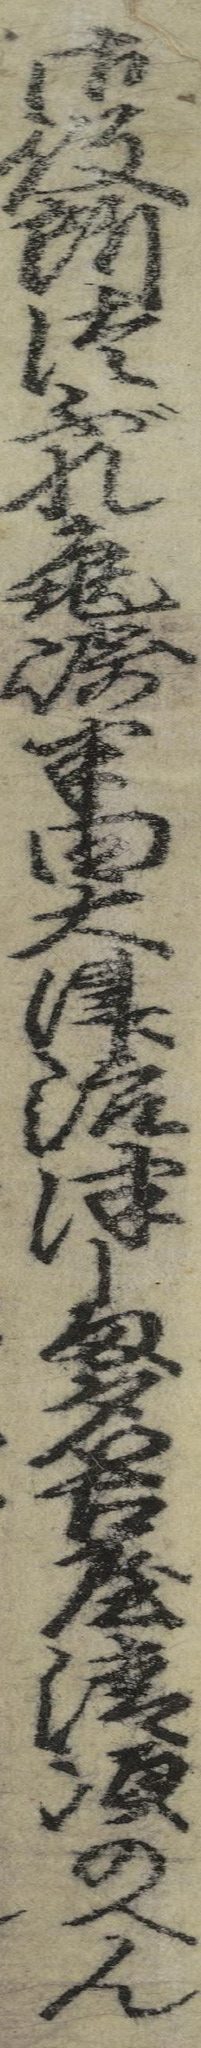御役所つぶれ亀崎半田大津浪津しま名古屋清須のへん
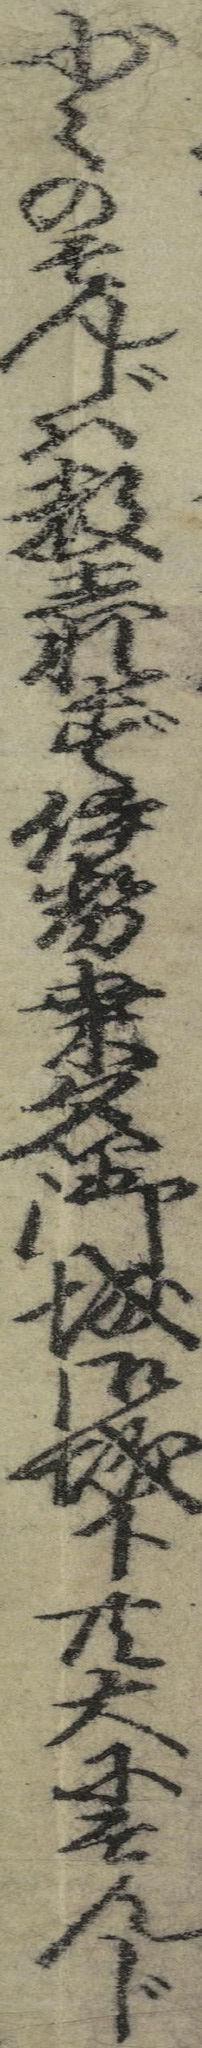少々のそんじハ数しれず伊勢桑名御城御城下共大にそんじ
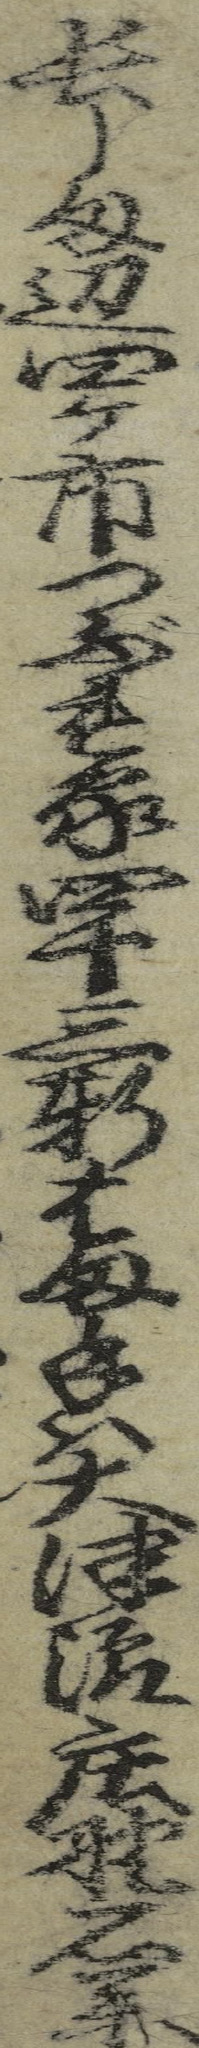長しま辺四ケ市つぶれ家四十三軒はま手ハ大津浪庄野石薬
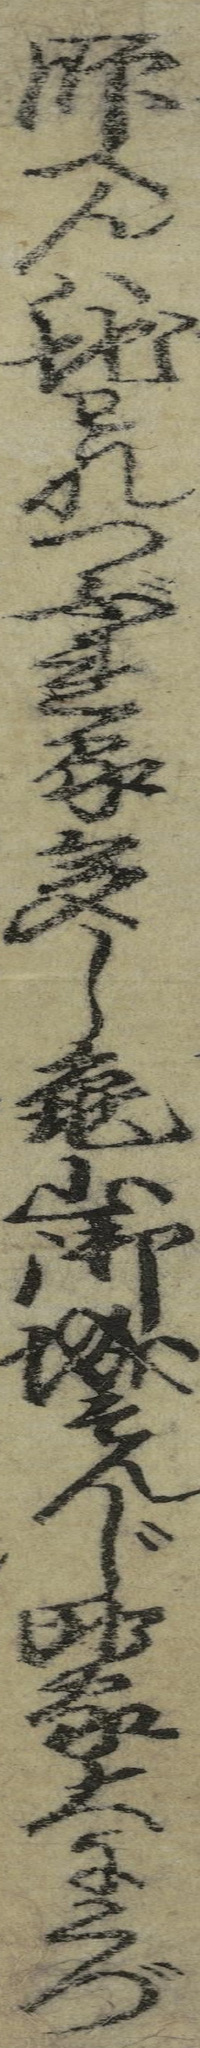師ヘんハ地われつぶれ家多し亀山御城そんじ町家大にくづ
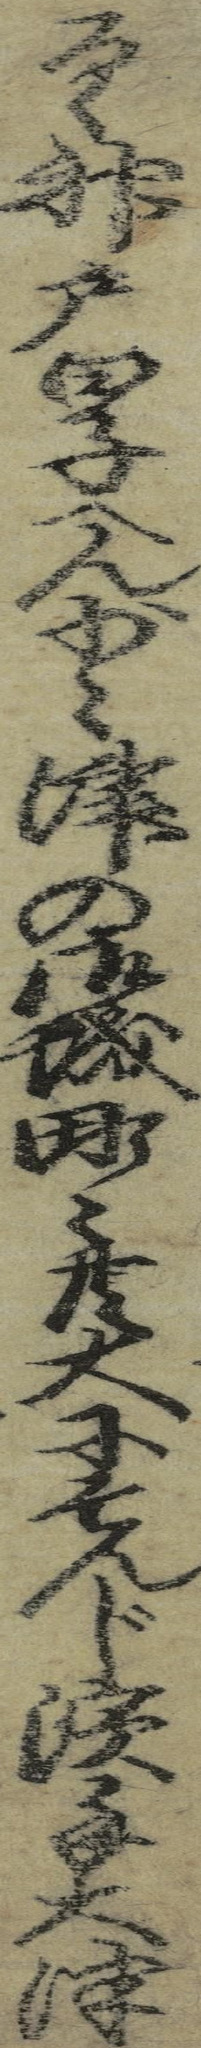ろく神戸田子へん少々津の御城町々共大にそんじ浜手大津
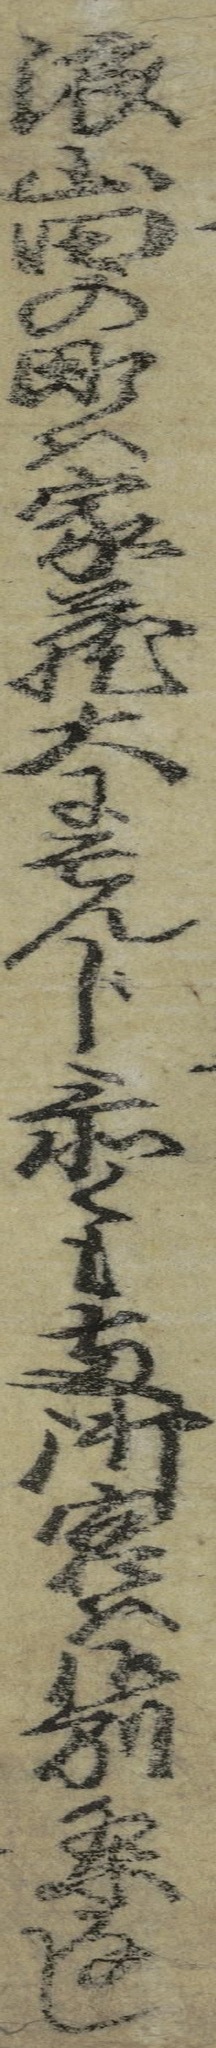浪山田の町ハ家蔵大にそんじ忝くも両御宮ハ別条なし
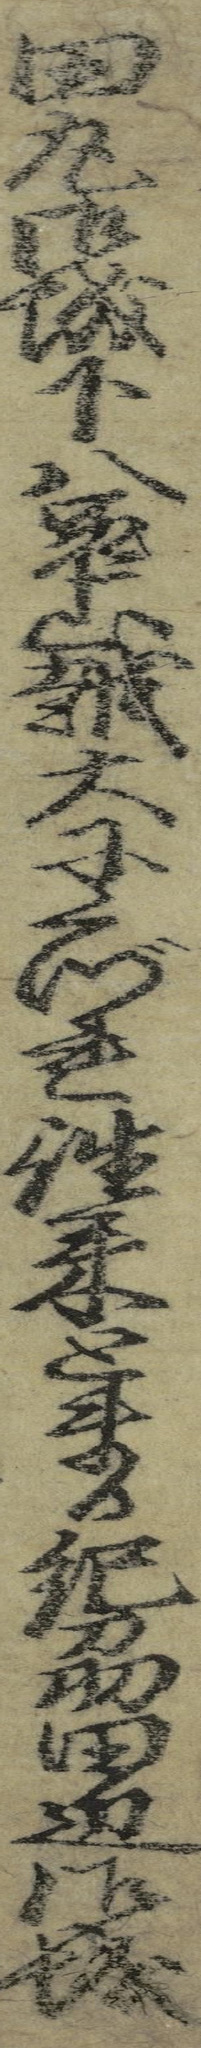田丸御城下ハ鬼山越大にくづれ往来とまる紀州田辺御城
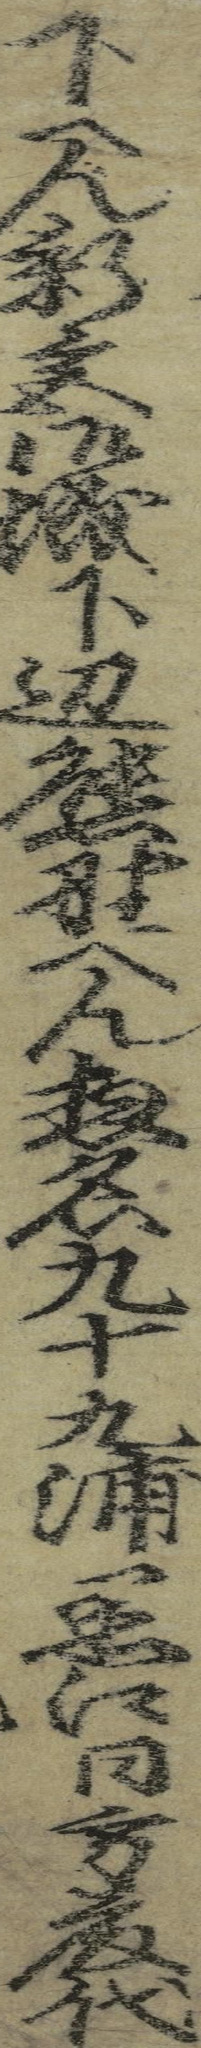下へん新宮御城下辺熊野へん惣名九十九浦黒江日方藤代
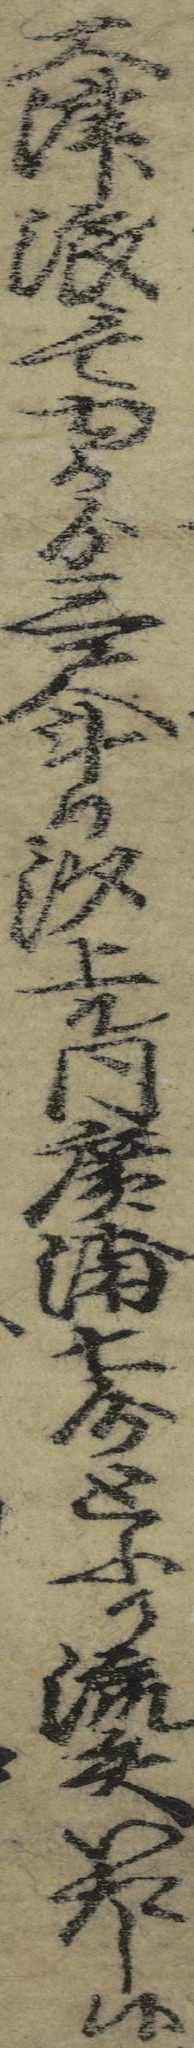大津浪ニてゆかゟ三尺斗り汐上ル同廣浦七分とふり流失いたし候
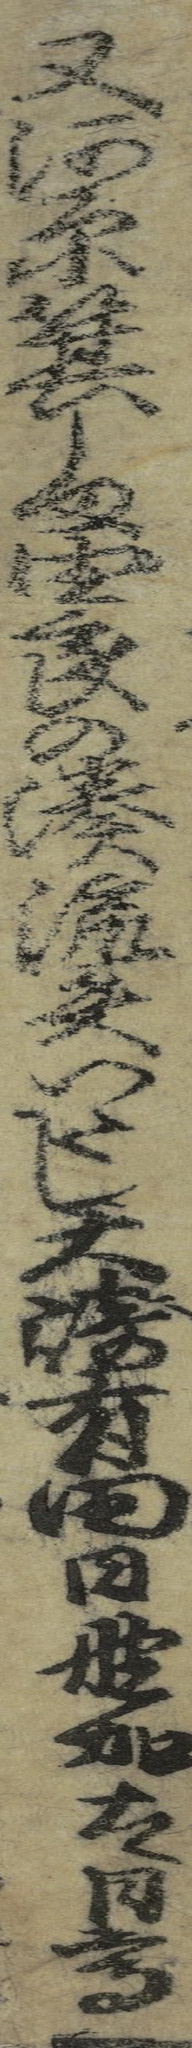又瓦箕しま由良の湊流失いたし大崎有田日野加太日高
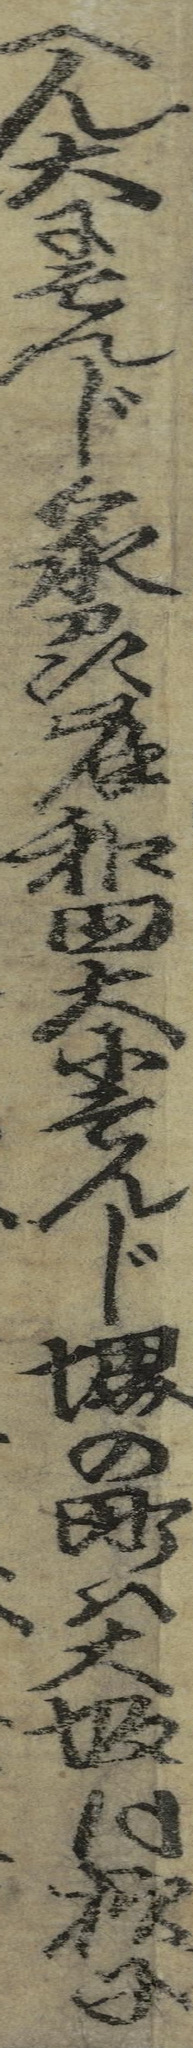へん大にそんじ泉州岸和田大にそんじ堺の町ハ大坂同様に
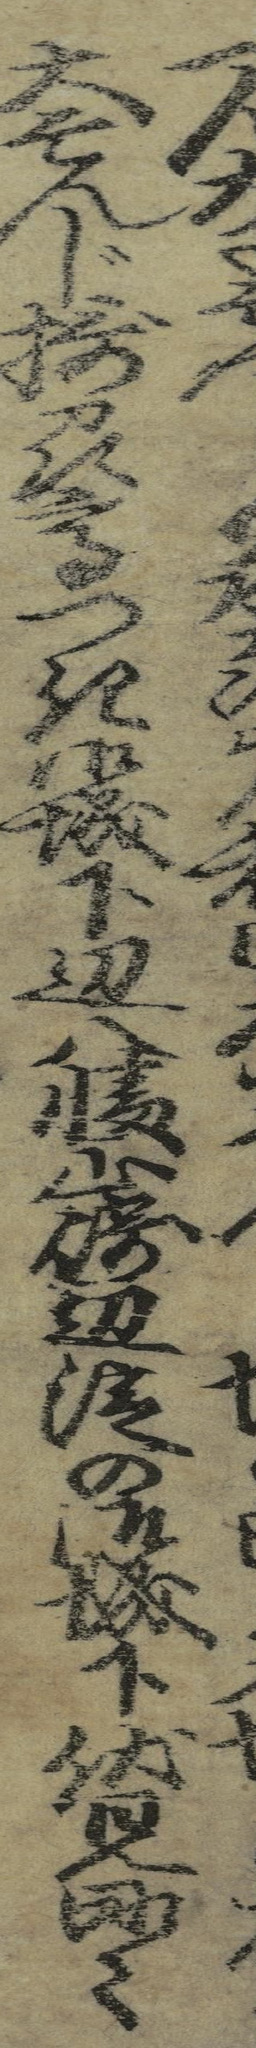にそんじ津州高つき御城下辺八幡山崎辺淀の御城下伏見町々
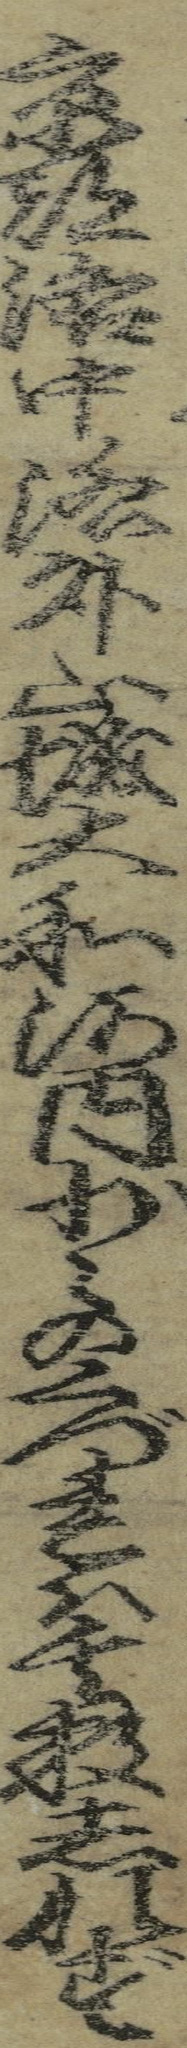京都洛中洛外山城大和河内少々のくずれハ其数しれず
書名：大地震大津浪場所聞書上之覺
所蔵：東京大学地震研究所図書室 Earthquake Research Institute Library, The University of Tokyo, JAPAN
